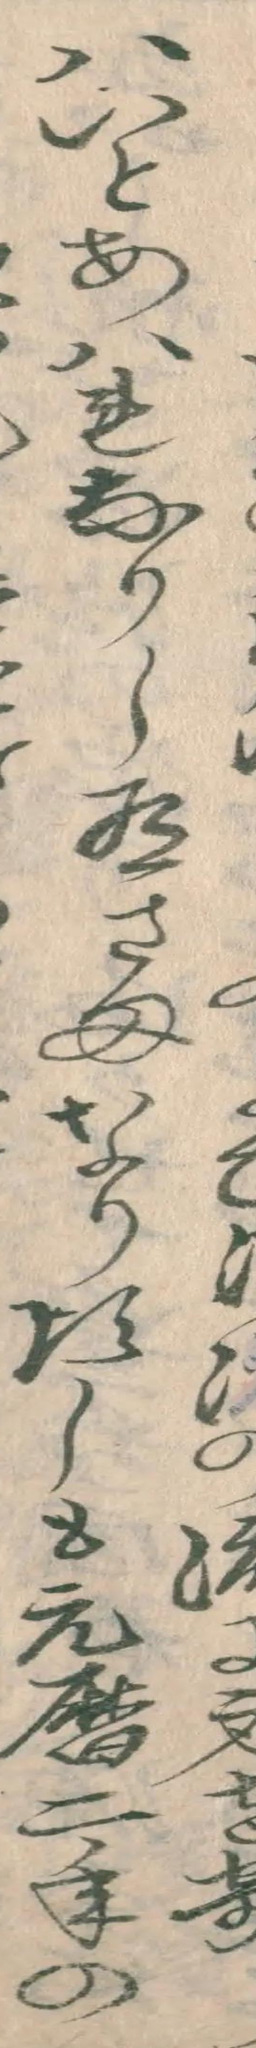はいとあはれなりし有さまなり頃しも元暦二年の
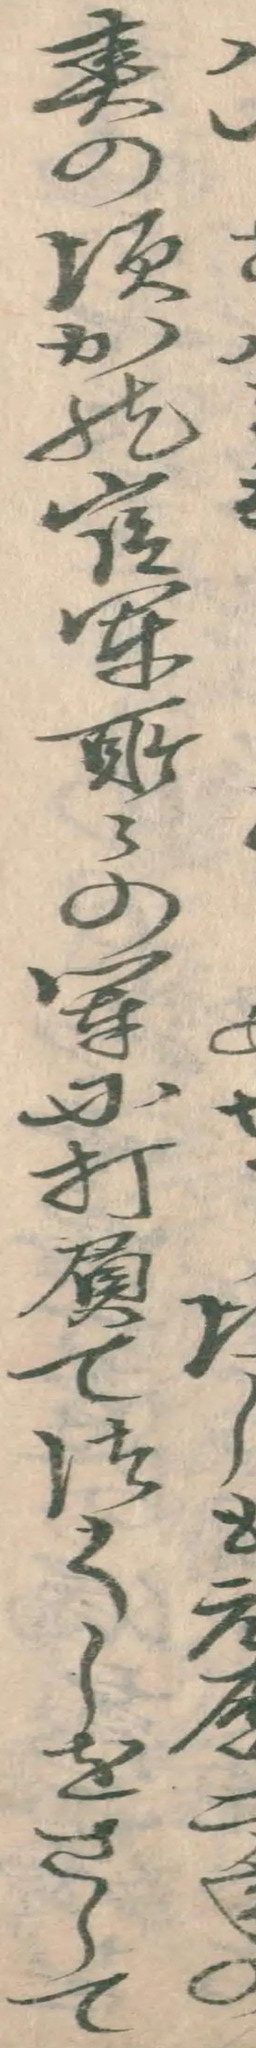春の頃かの官軍所々の軍に打負てつくしをさして

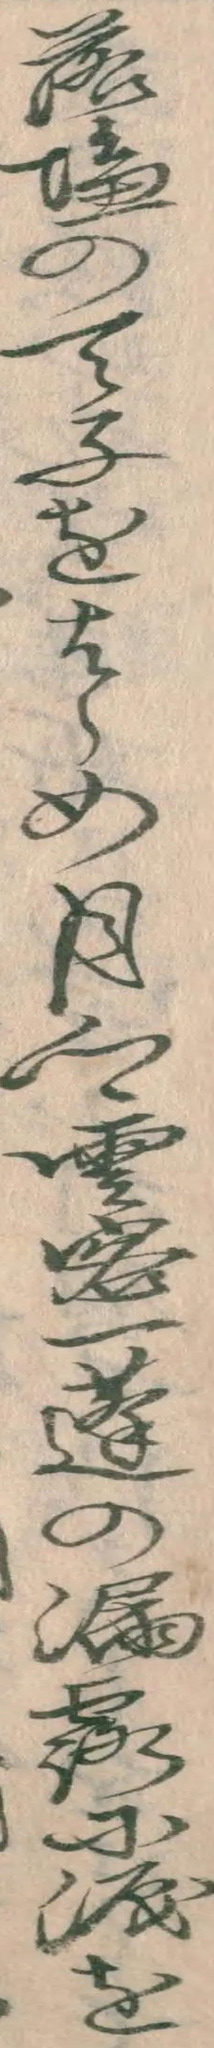落塩の天子をはしめ月卿雲客一蓬の漏露に涙を
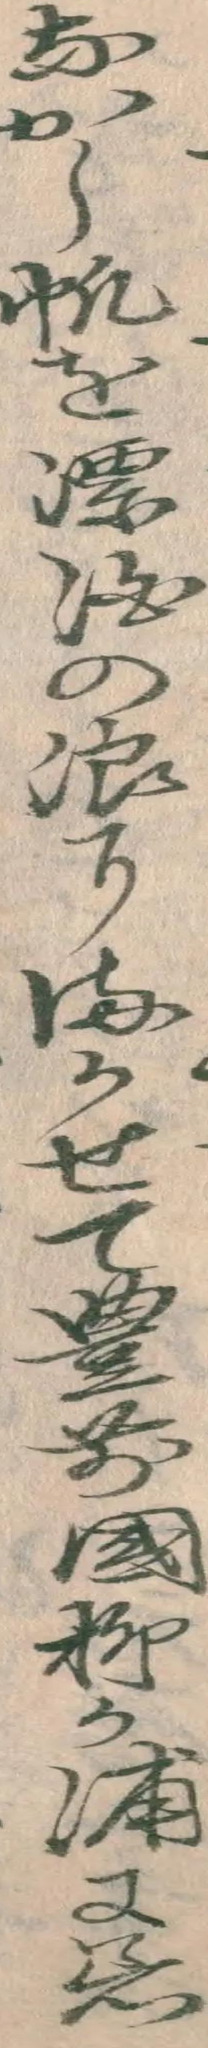なかし帆を漂泊の浪にまかせて豊前国柳か浦に着
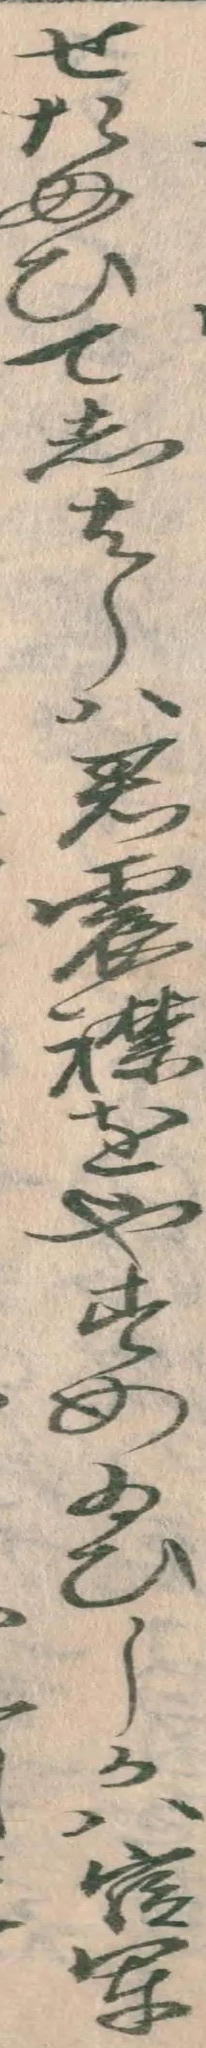せたまひてしはしは君震襟をやすめ給ひしかは官軍
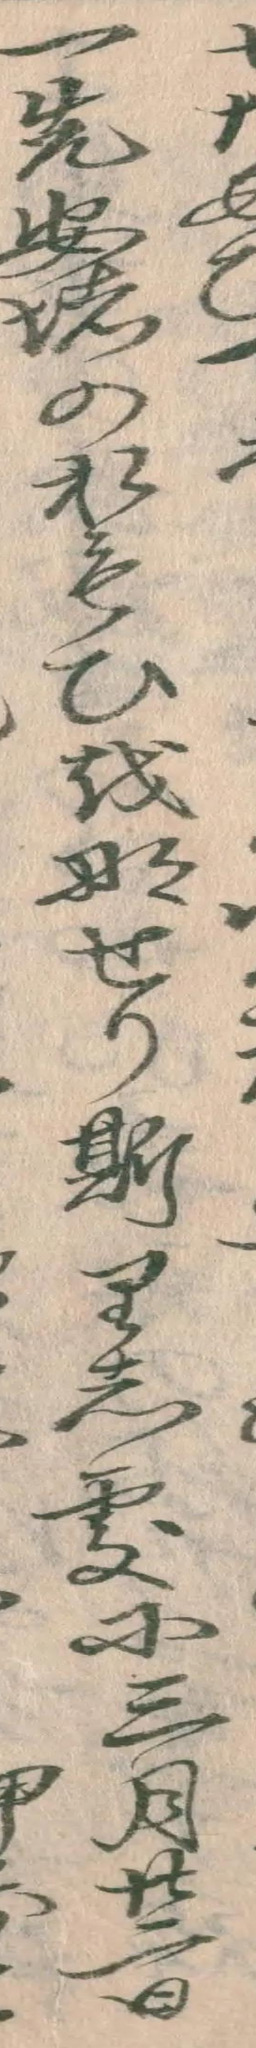一先安堵のおもひをなせり斯りし処に三月廿ニ日
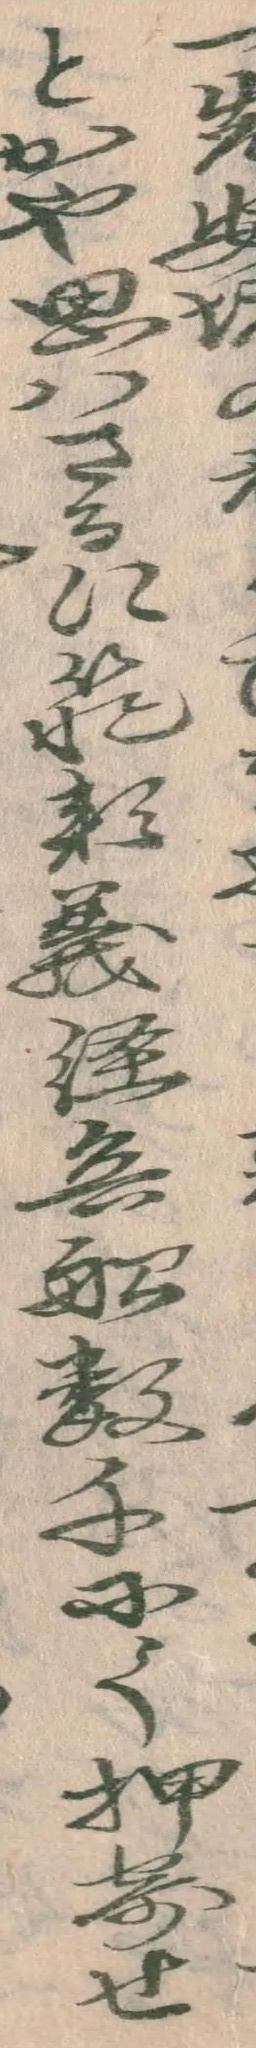とかや思はさるに範頼義経兵船数千にて押寄せ
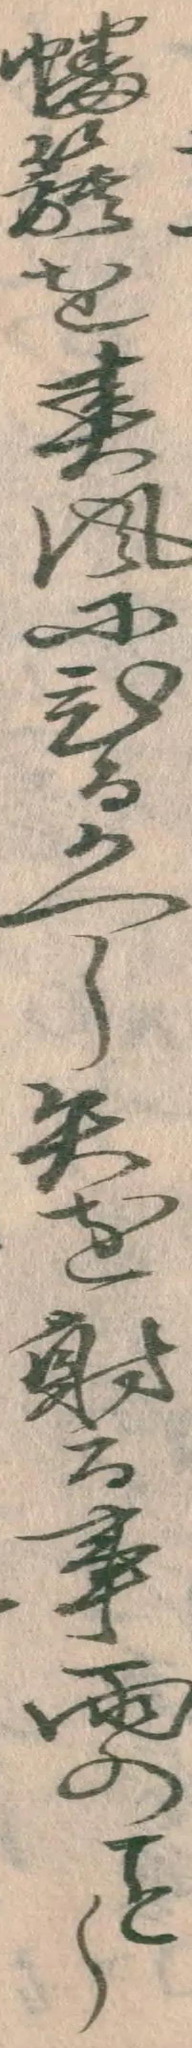幡籏を春風にひるかへし矢を射る事雨のことし
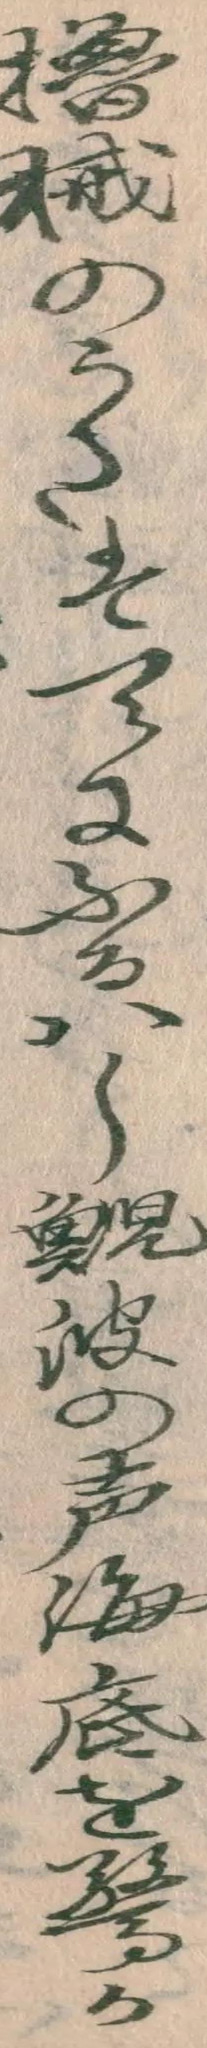櫓械のうたは天にふるはし鯢波の声海底を驚か
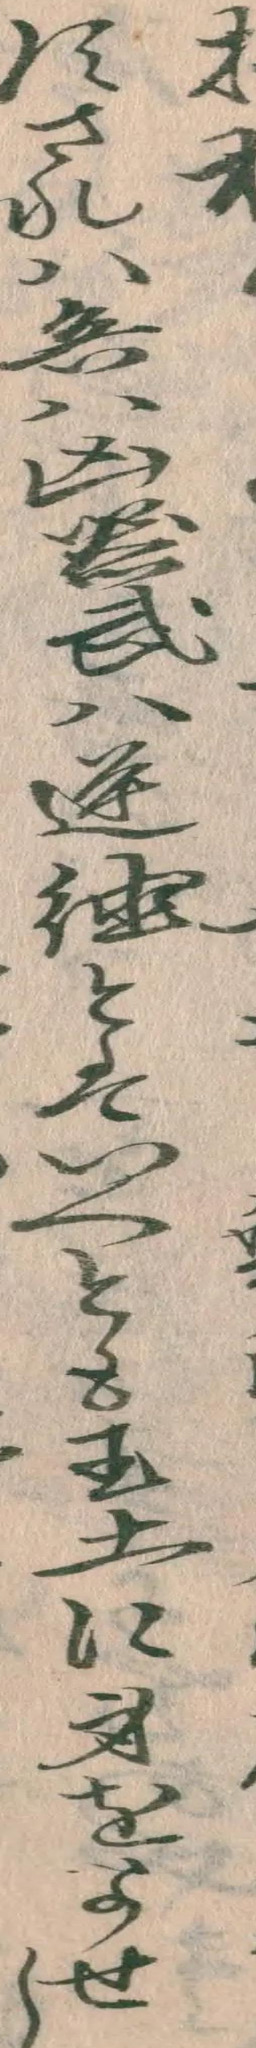すされは兵は凶器武は逆徳とはいへとも王土に身をよせし
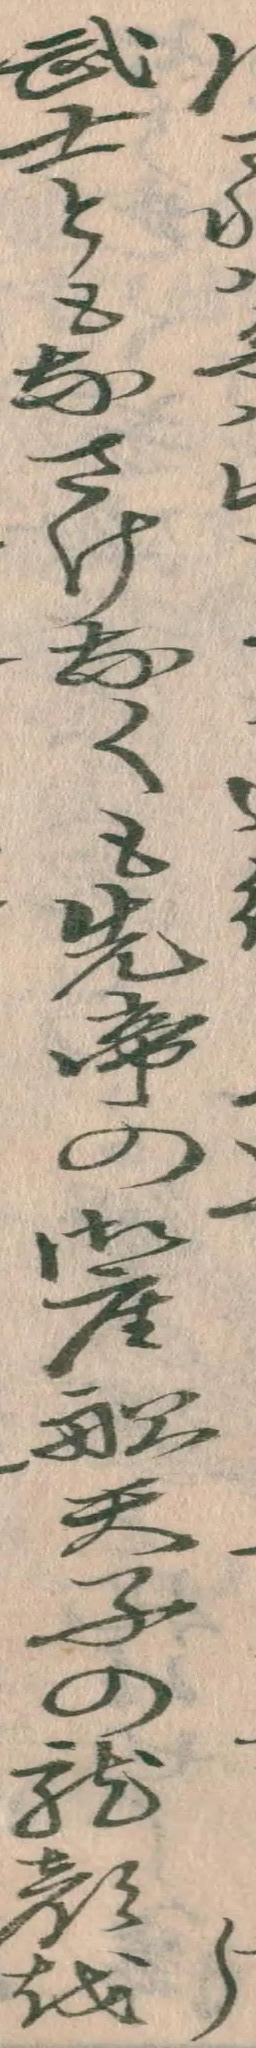武士ともなさけなくも先帝の御座船天子の龍顔を
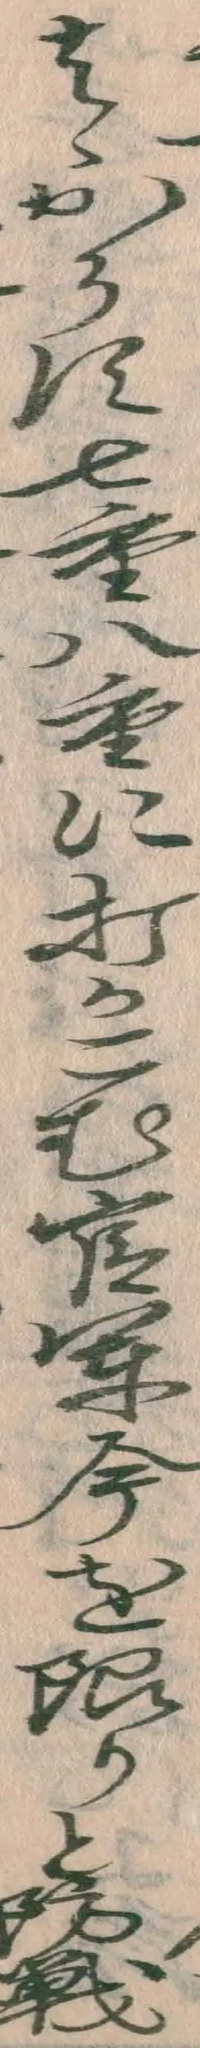はゝからす七重八重に打かこむ官軍今を限りと防戦
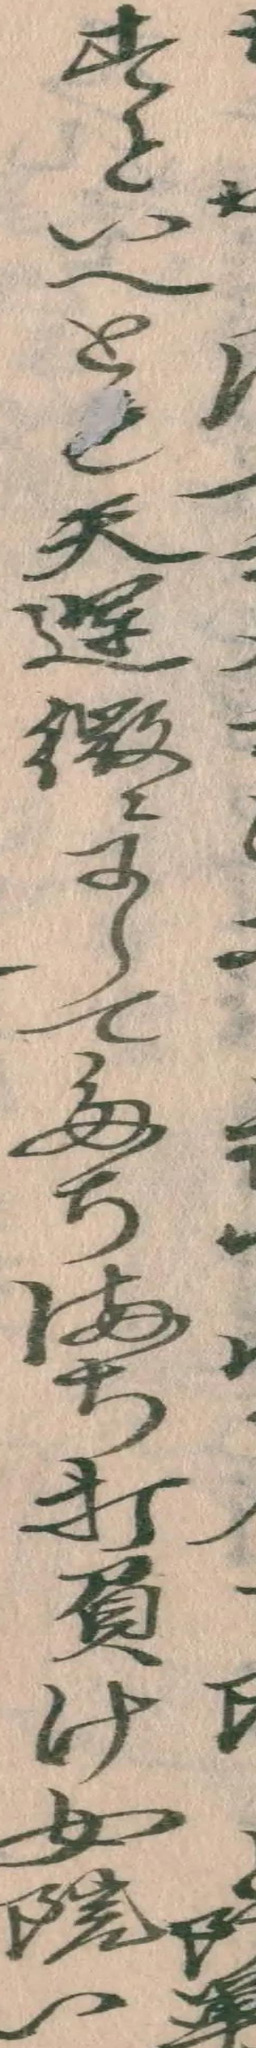すといへど天運微々にしてたちまち打ち負け女院い
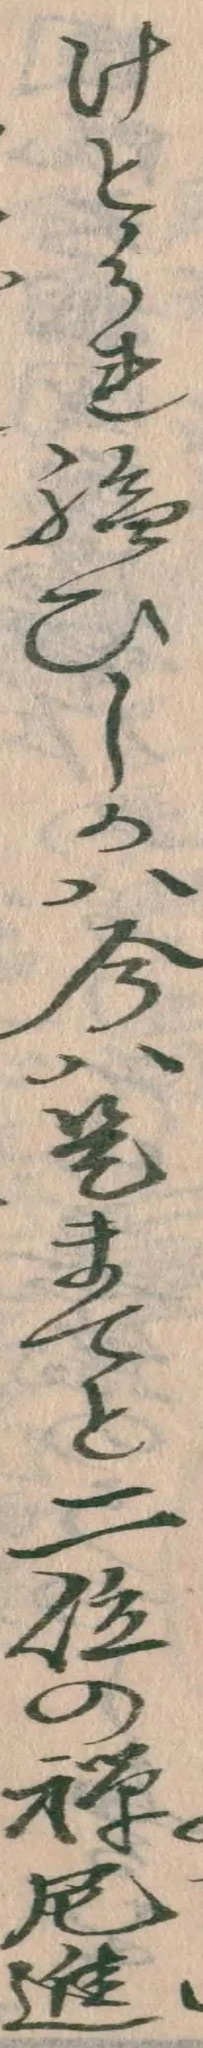けとられ給ひしかは今は是まてと二位の禅尼進
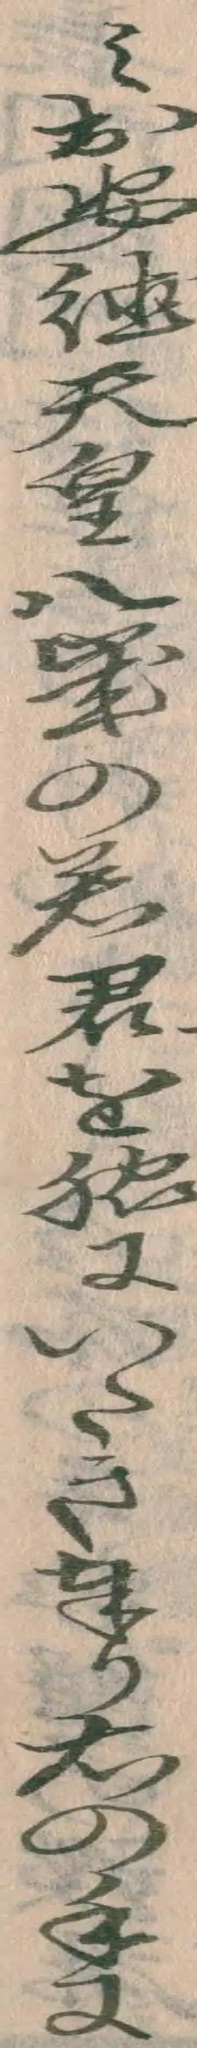み出安徳天皇八歳の若君を脇にいたき奉り右の手に
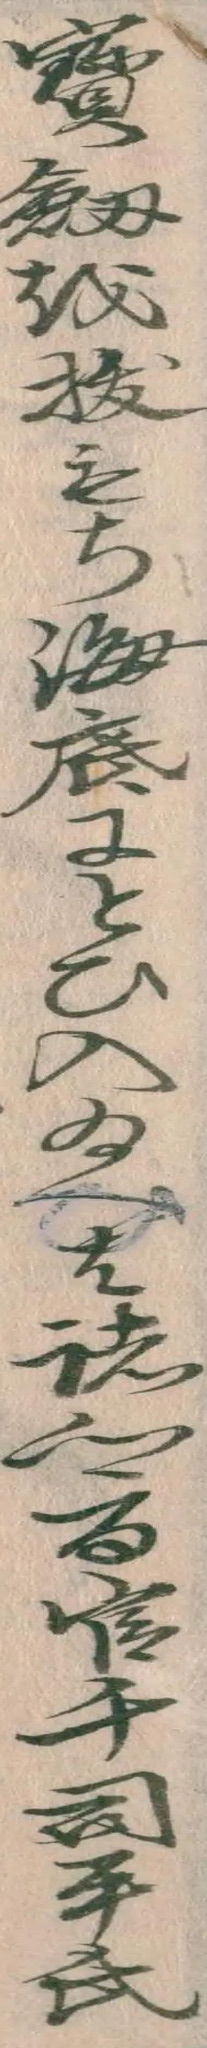宝剣を抜もち海底にとひ入給へは諸卿百官千司平氏
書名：千蟲譜 3巻. [3]
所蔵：国立国会図書館 National Diet Library, JAPAN
